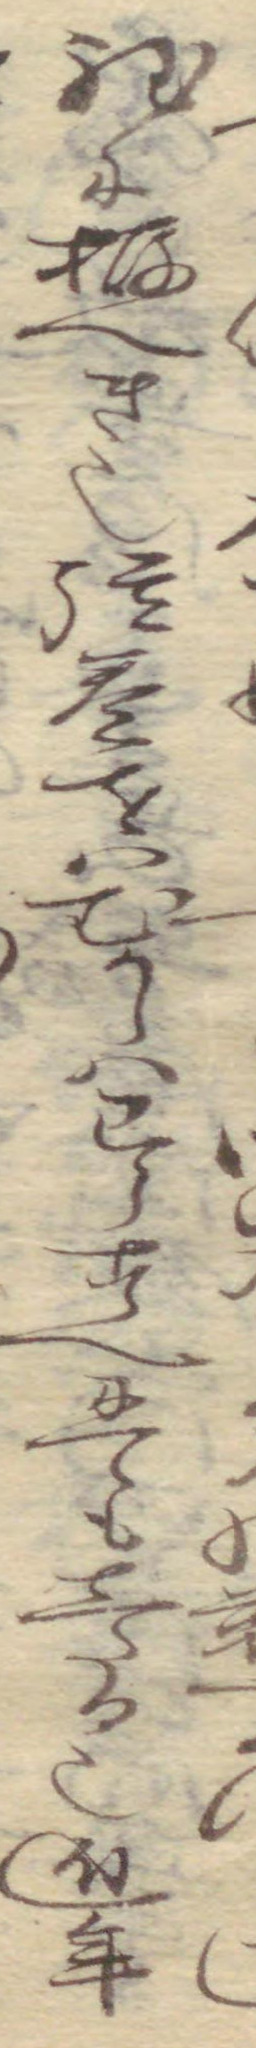程に拵へき也弦巻をはむかしハわらすへにてもしたる也近年
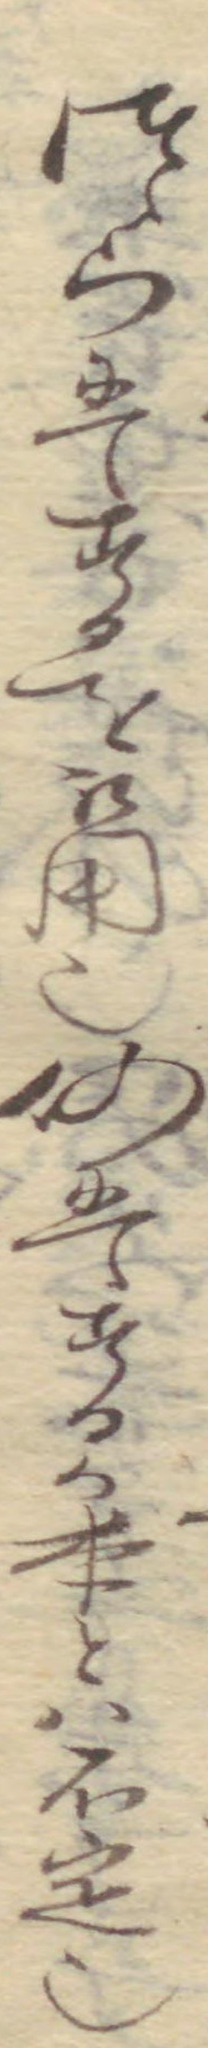つゝらにてするを被用也何にてするか本とハ不定也
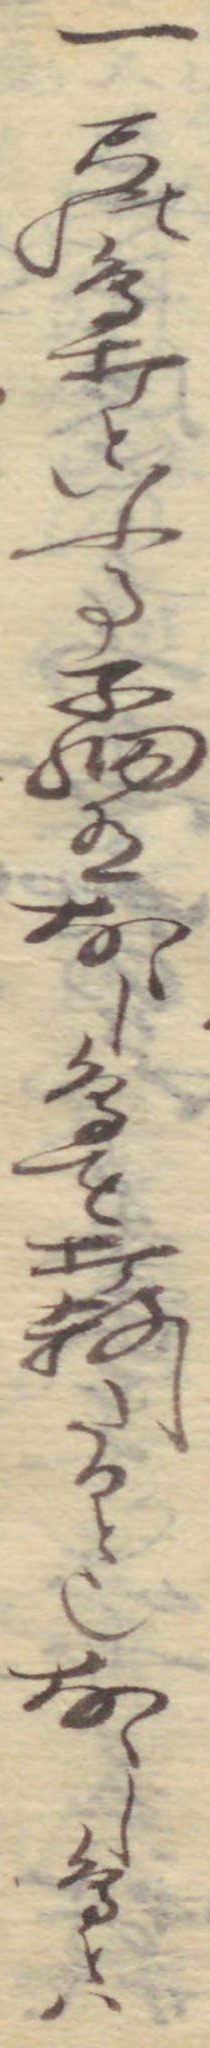一弓の鳥打といふ事子細有なゝし鳥を打殺したるたると也なゝし鳥とハ
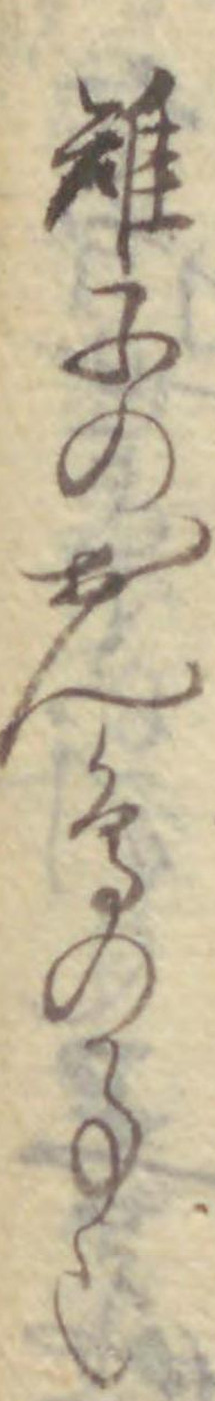雉子のおん鳥の事也
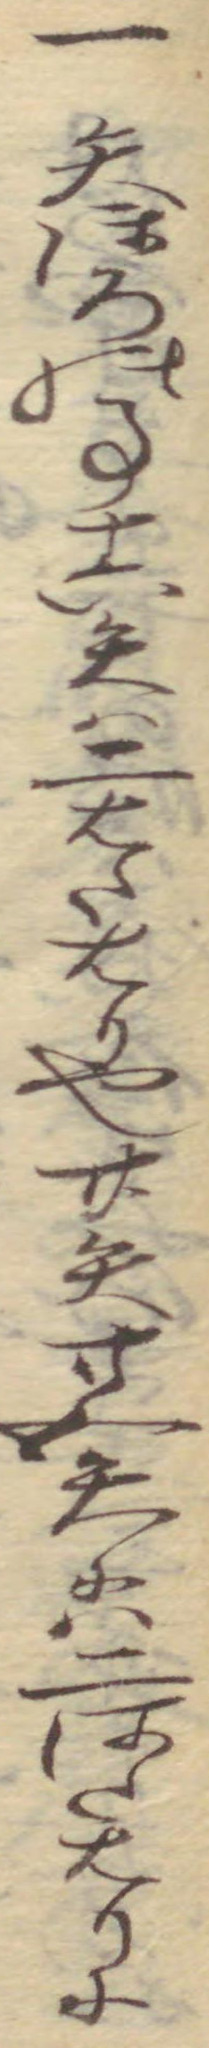一矢ほろの事十六矢ハ二はたはり也廿矢廿五矢にハ二はたはりに
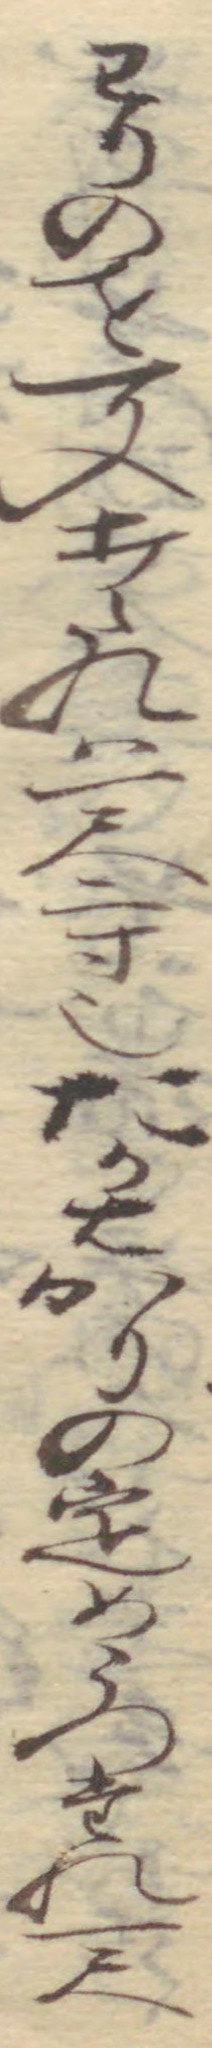わりのを可入打たれハ一尺二寸也たかはかりの定めうつたれ一尺
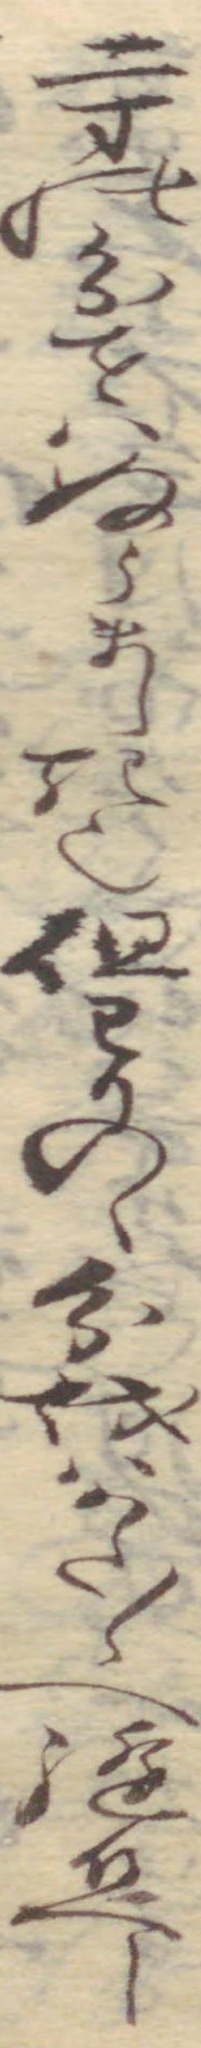二寸の分をハぬうましき也但わりのゝ分をハかた〳〵へ縫付へし
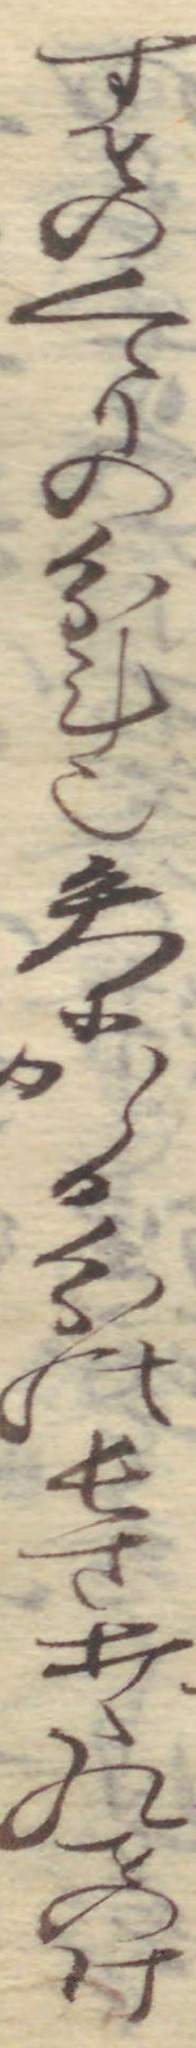すそのくゝりの分斗也矢にかゝる分の長さ打たれをのけ
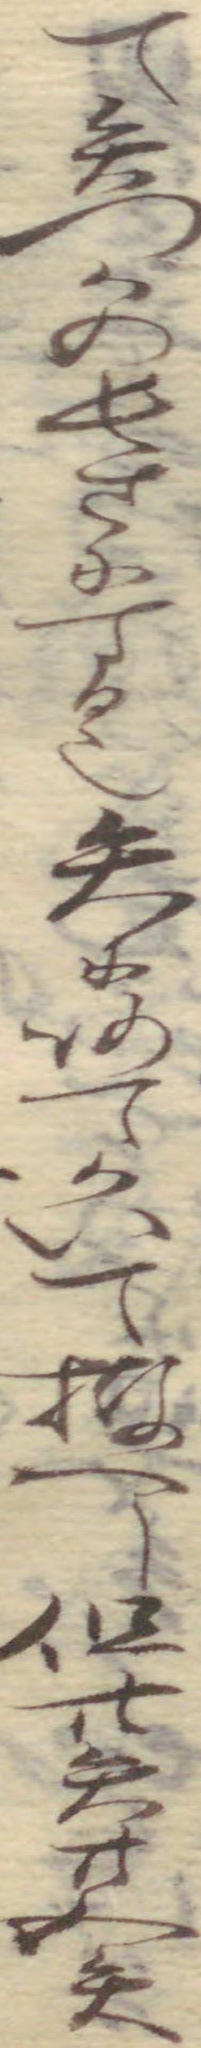て矢つかの長さにする也矢にあてかいて拵へし但廿矢廿五矢
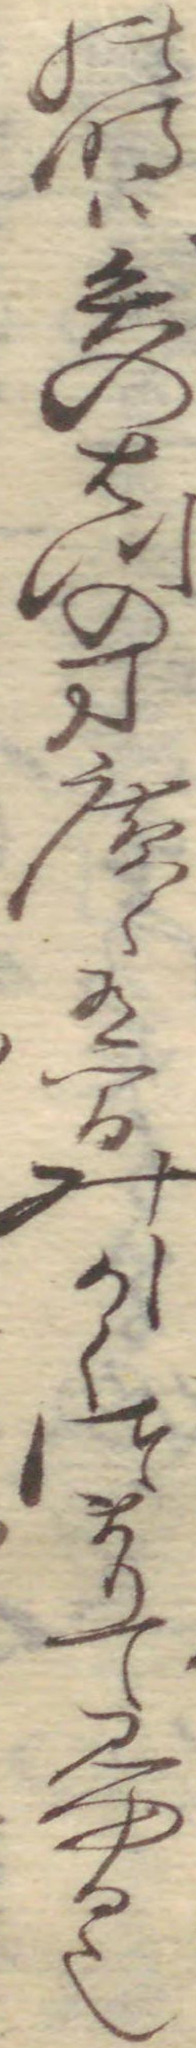の時ハ矢のはつの方広く有間みしかくつまりて見ゆ也
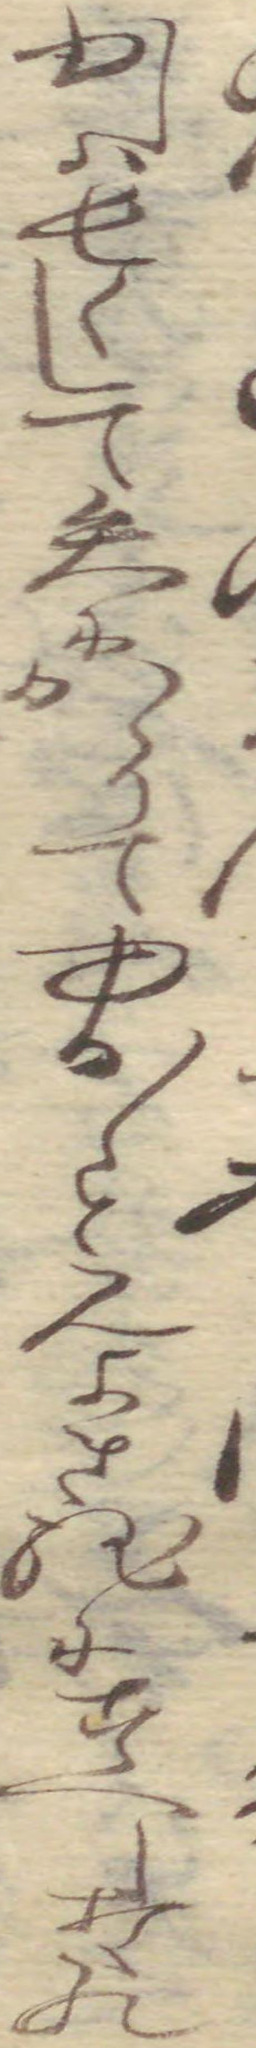少しハ長くして矢にかゝりてゆる〳〵と見よき程にすへし打たれ
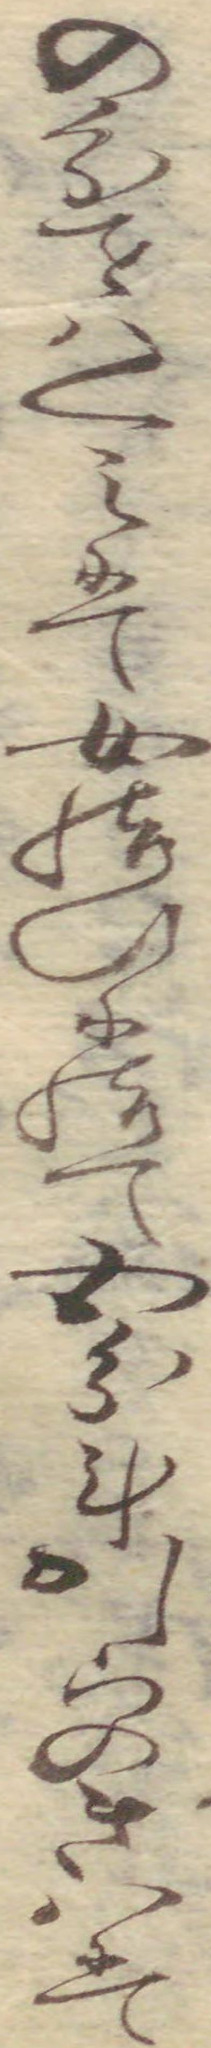の分をハくミにて女結ひに結て五分斗かしらのきハにて
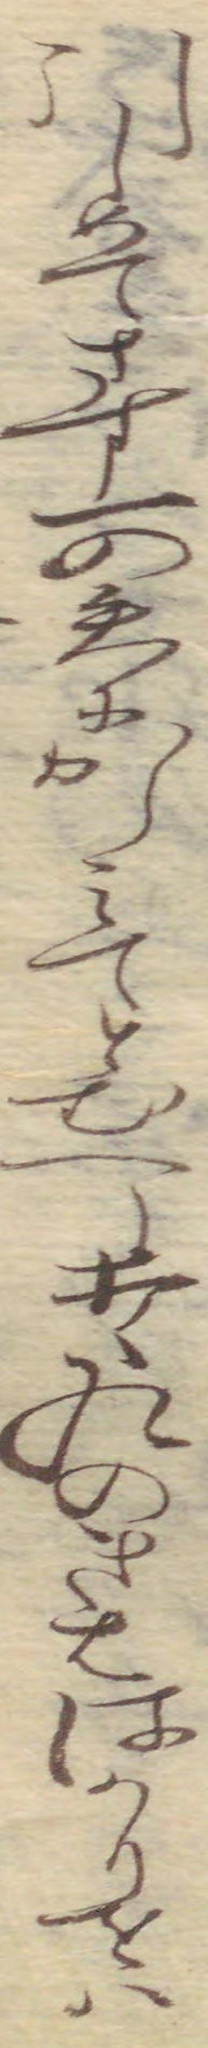引しめしめてさす一の矢にからミてとむへしうち打たれのきははかりをハ
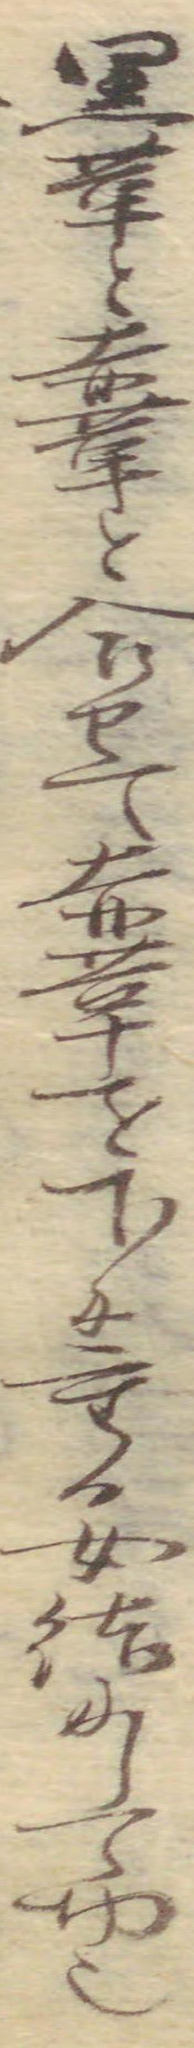黒革と赤革と合せて赤革を下に重る女結にして切也
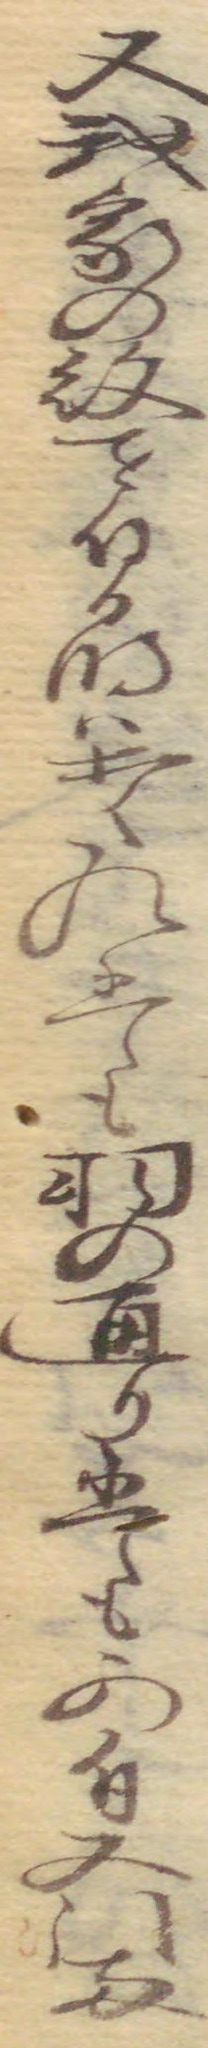又我家の紋を付る時ハ打たれにても羽の通りにても可付又引両

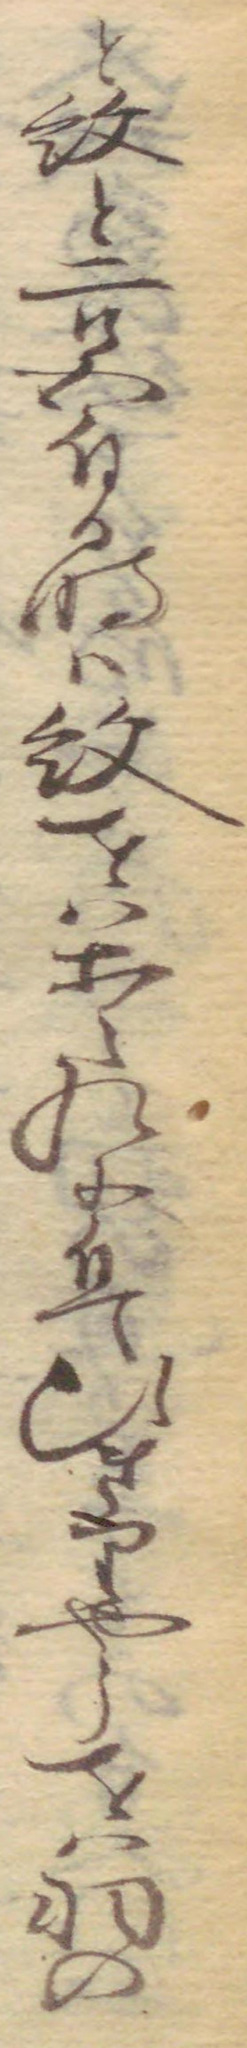と紋と二色付る時ハ紋をハ打たれに付てひきりやうをハ羽の
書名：鶯宿雑記. 巻199-200
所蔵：国立国会図書館 National Diet Library, JAPAN
